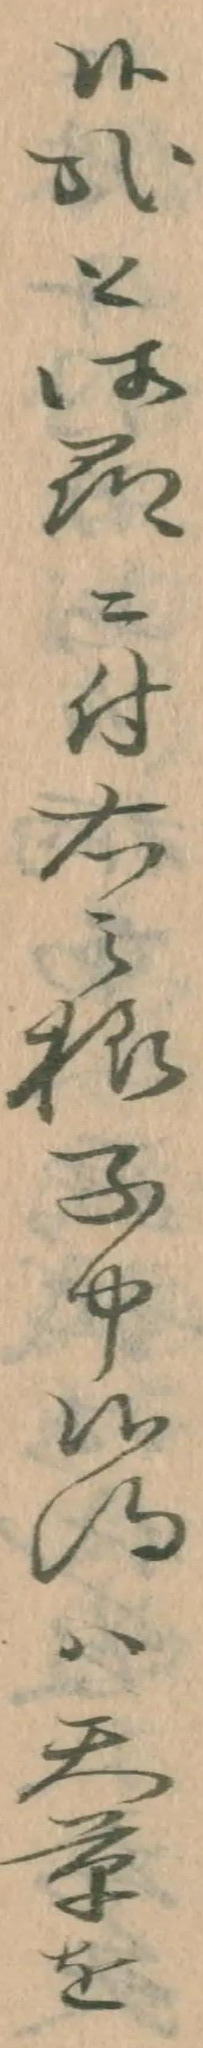候哉と御尋に付右之様子申候得は天草を
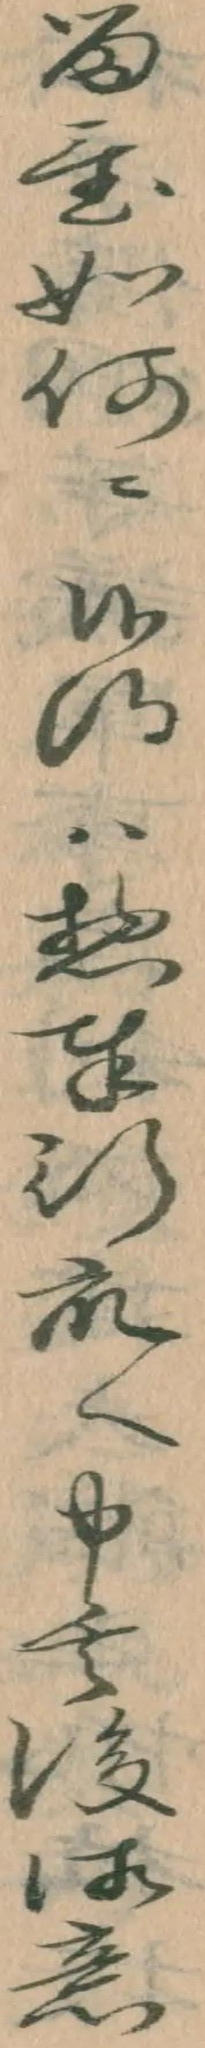留置如何に候得は惣奉行衆へ申其後御意
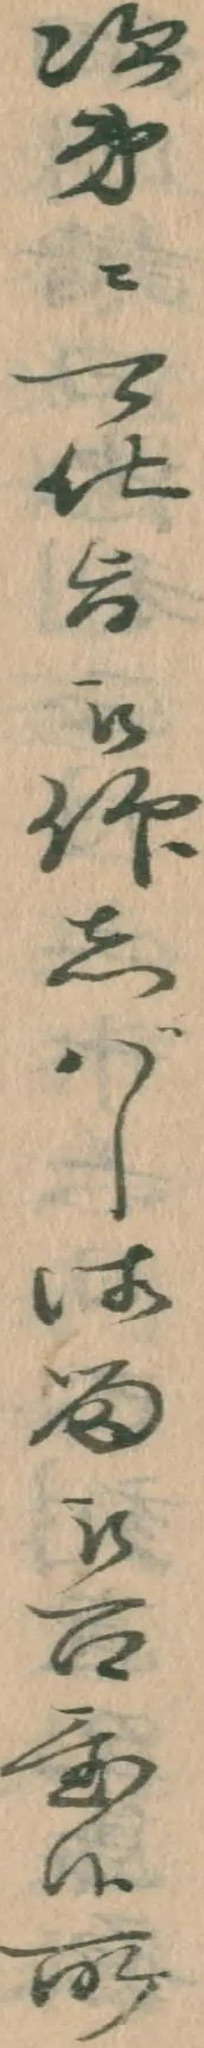次第に可仕旨被仰志ばし御留被召置候所
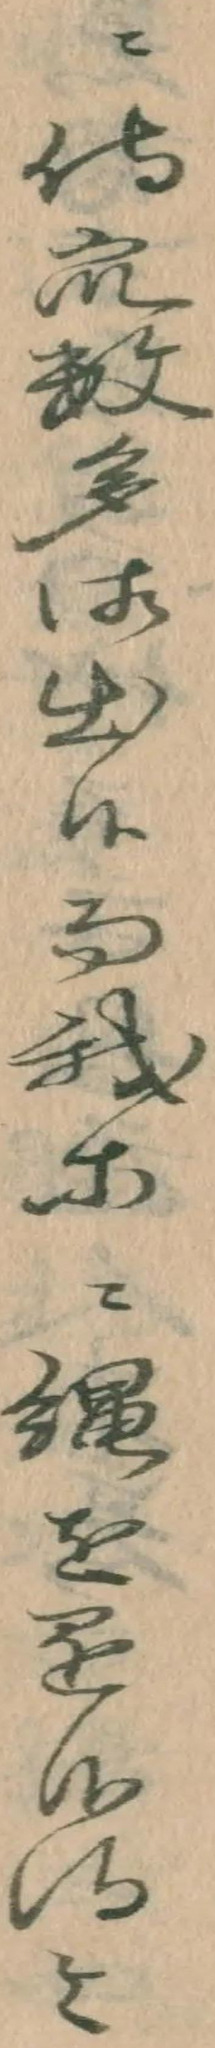に侍衆数多御出候而我等に縄を懸候得与
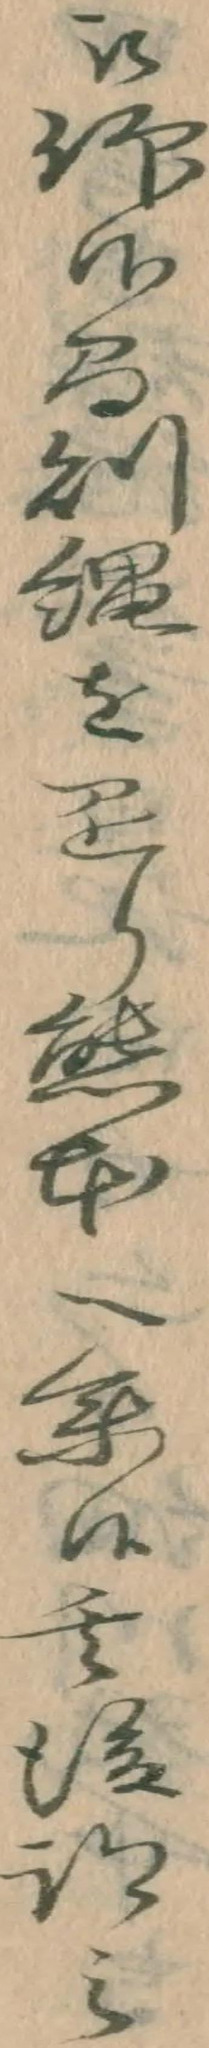被仰候間則縄を懸り熊本へ参候其後跡之
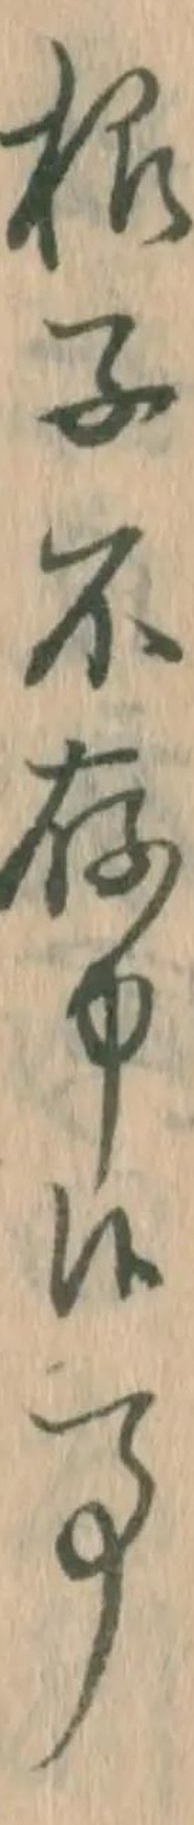様子不存申候事
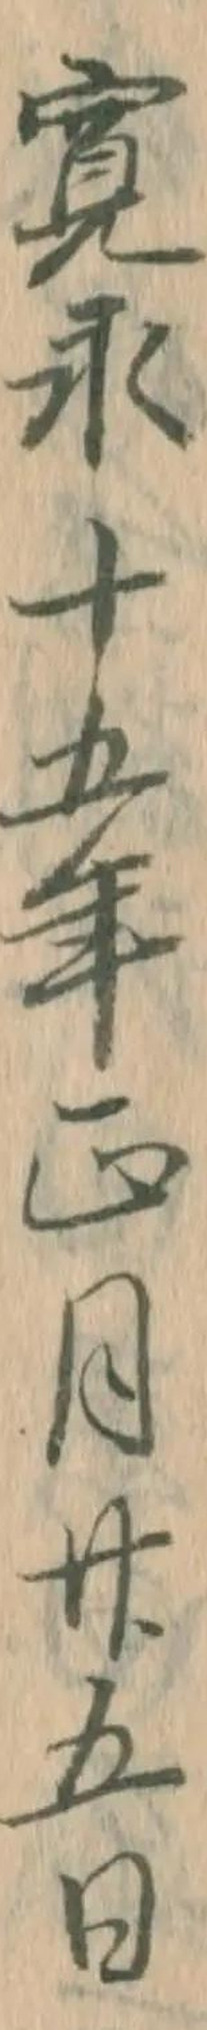寛永十五年正月二十五日
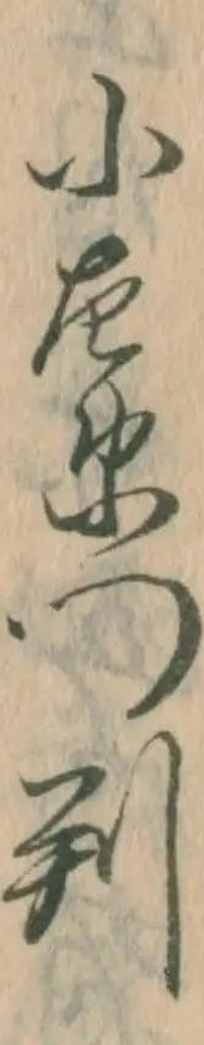小左衛門判
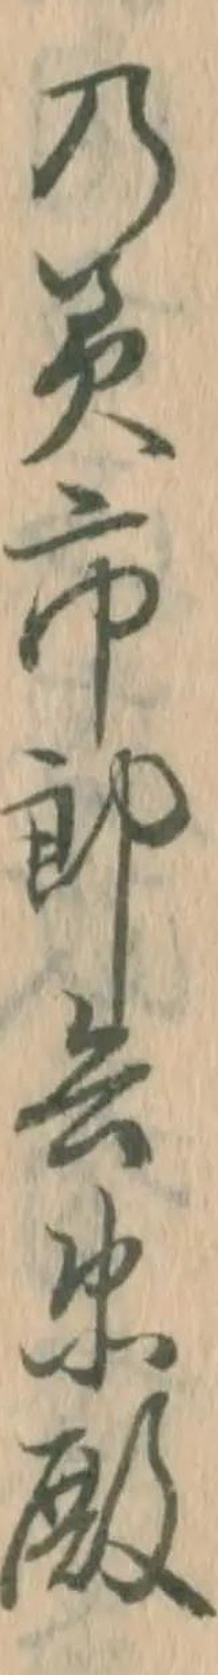乃美市郎兵衛殿
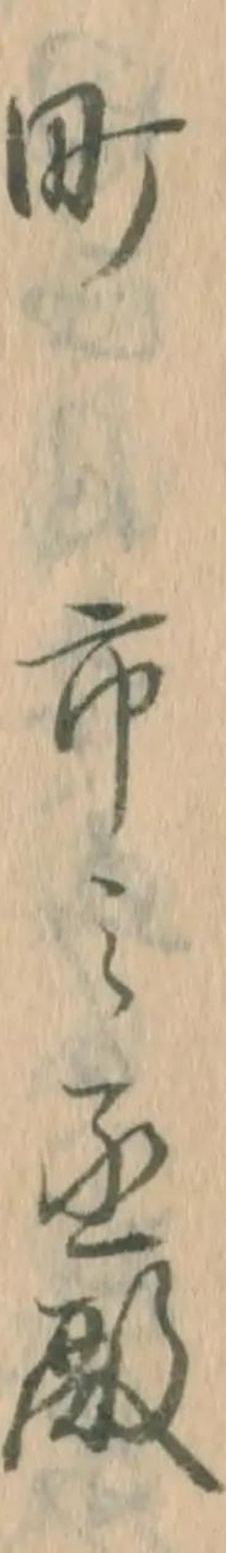町市之丞殿

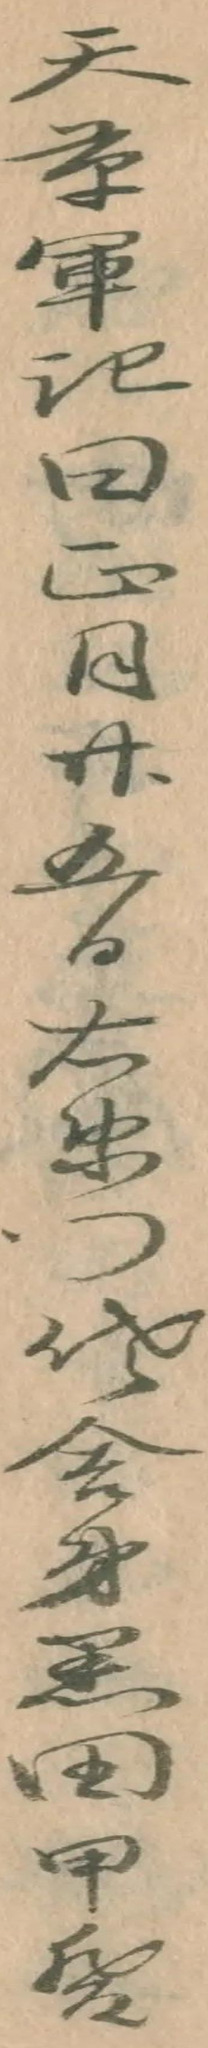天草軍記曰正月廿五日右衛門佐舎弟黒田甲斐
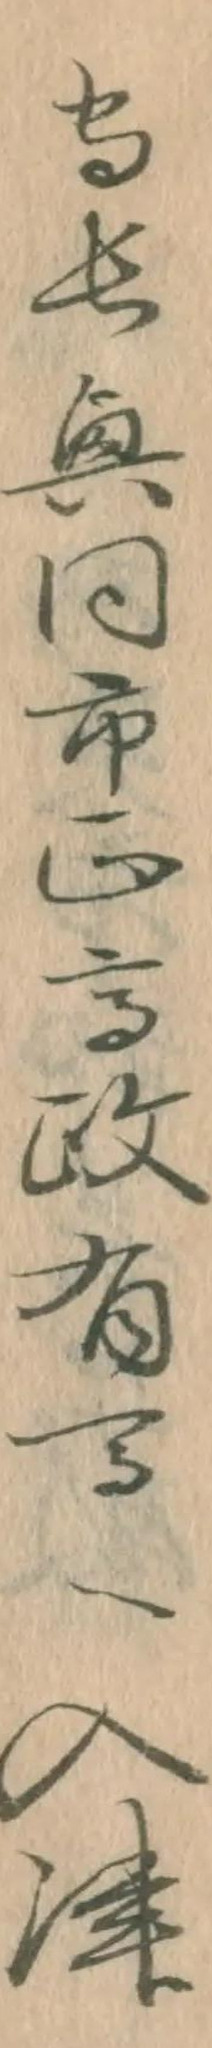守長興同市正高政有馬へ入津
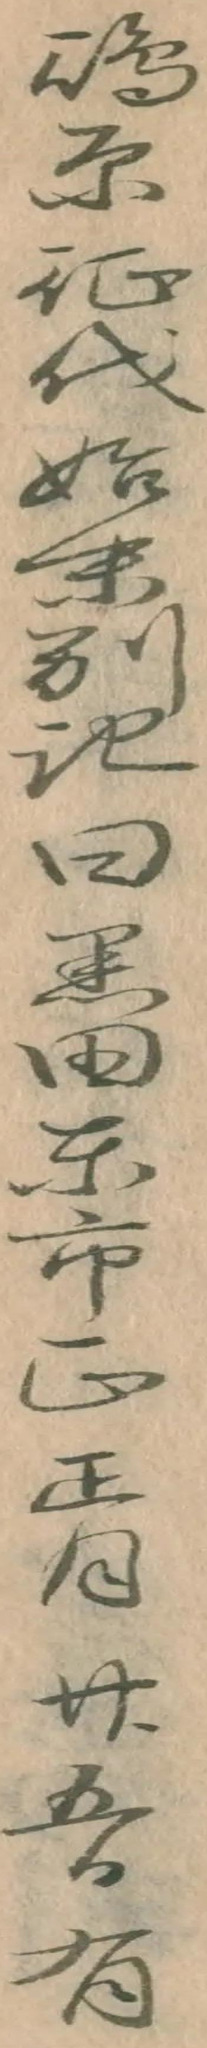島原征伐始末別記曰黒田東市正正月廿五日有
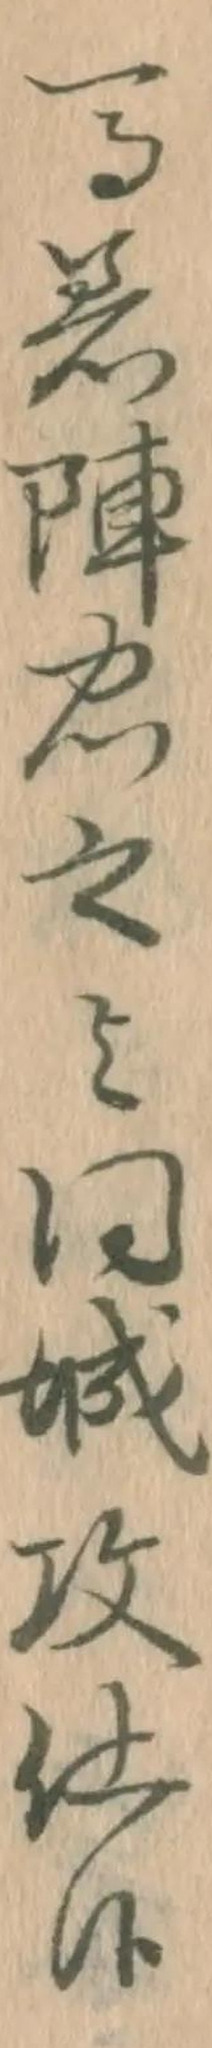馬着陣忠之与同城攻仕候
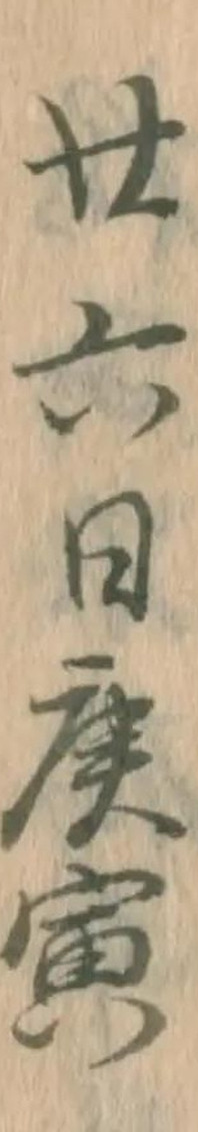廿六日庚寅
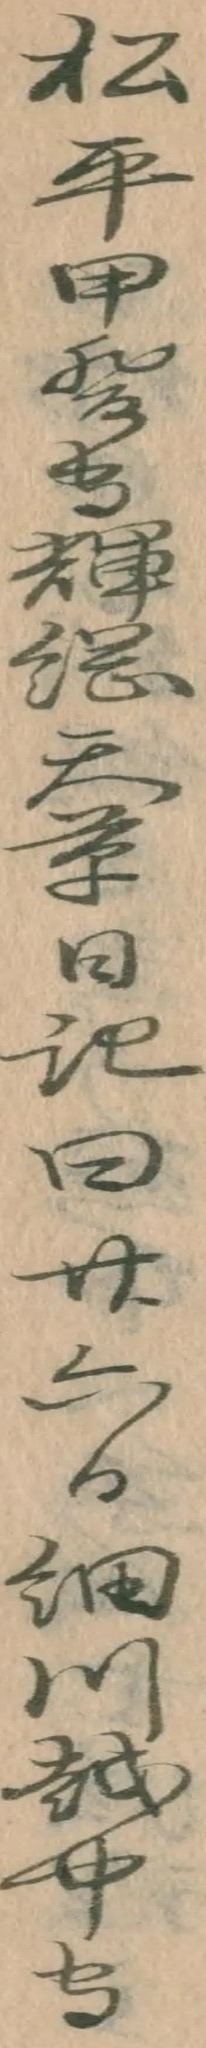松平甲斐守輝綱天草日記曰廿六日細川越中守
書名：切支丹御退治記 49巻. [6]
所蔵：国立国会図書館 National Diet Library, JAPAN
